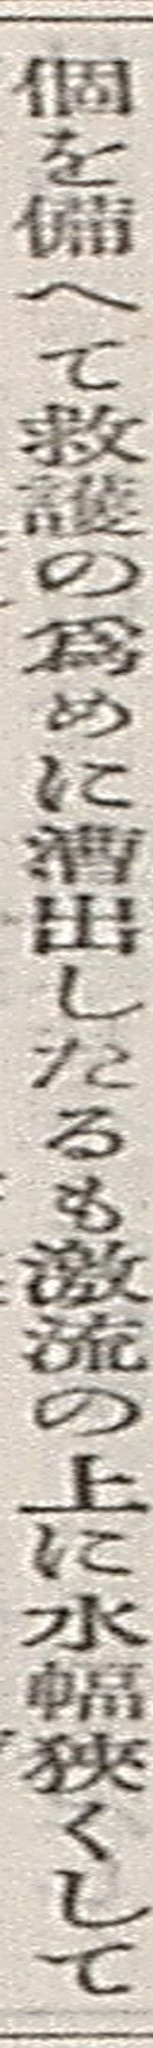個を備へて救護の為めに漕出したるも激流の上に水幅狭くして
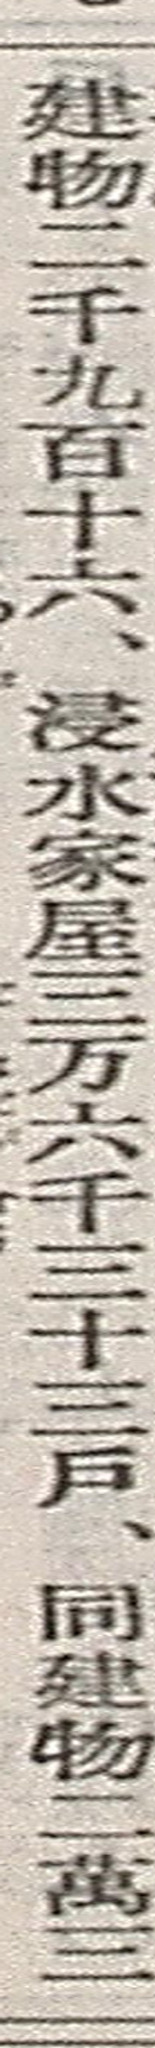建物二千九百十六、浸水家屋三万六千三十三戸、同建物二万三
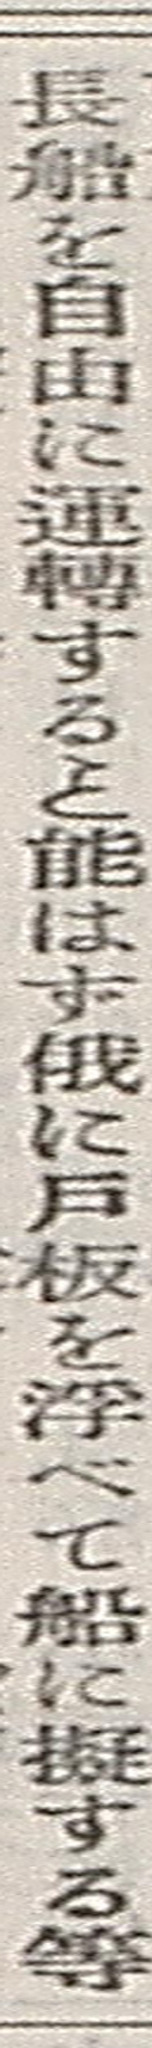長船を自由に運転すること能はず俄に戸板を浮べて船に擬する等
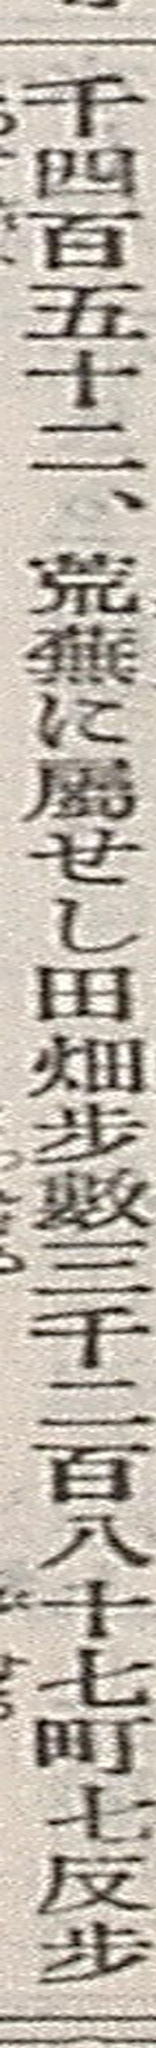千四百五十二、荒蕪に属せし田畑歩数三千二百八十七町七反歩
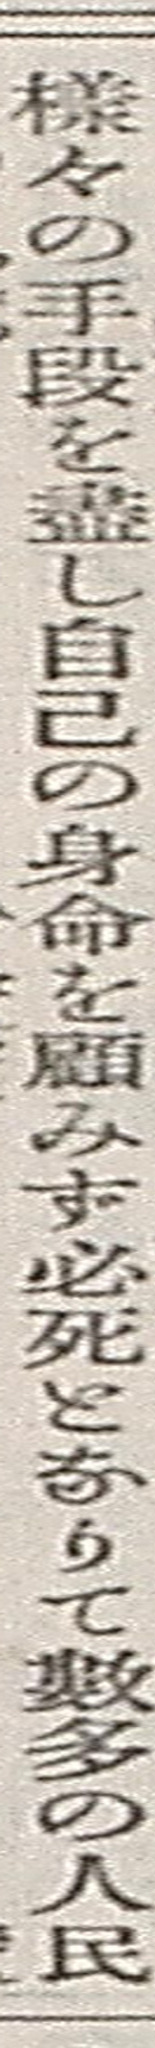様々の手段を尽し自己の身命も顧みず必死となりて数多の人民
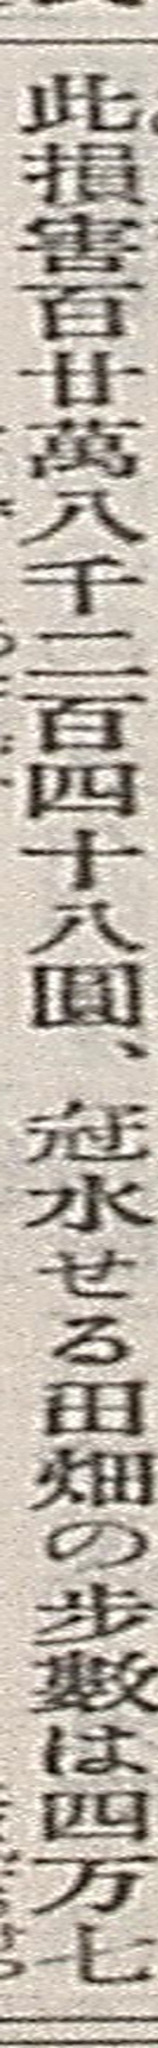此損害百廿万八千二百四十八円、冠水せる田畑の歩数は四万七
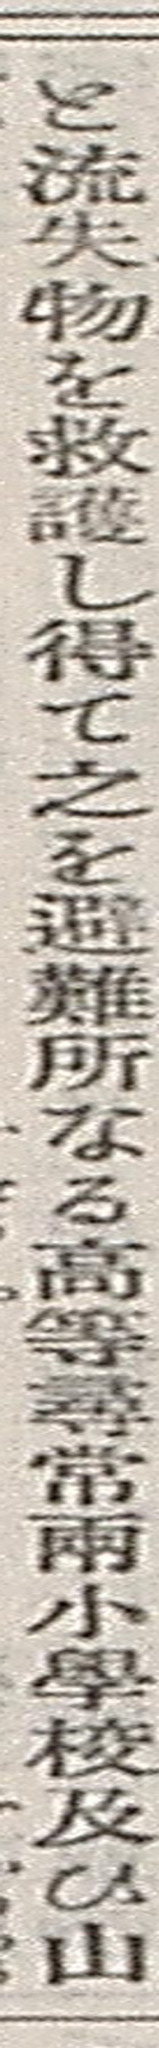と流失物を救護し得て之を避難所なる高等尋常両小学校及び山
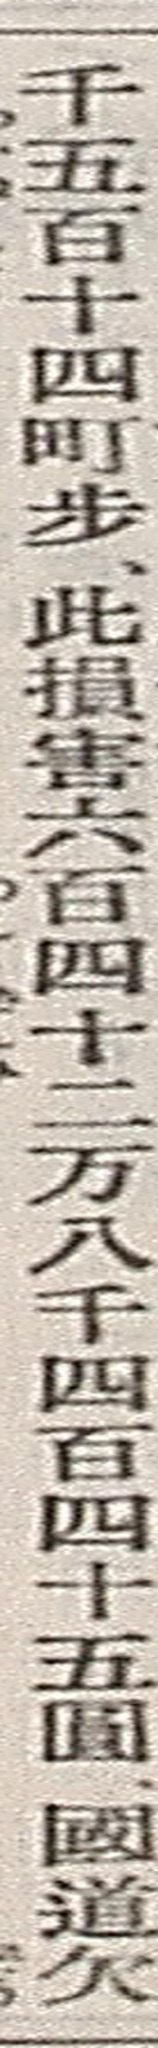千五百十四町歩、此損害六百四十二万八千四百四十五円、国道欠
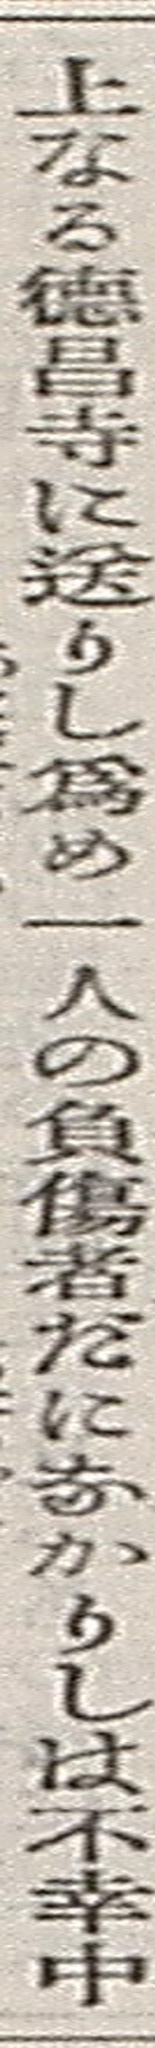上なる徳昌寺に送りし為め一人の負傷者だになかりしは不幸中
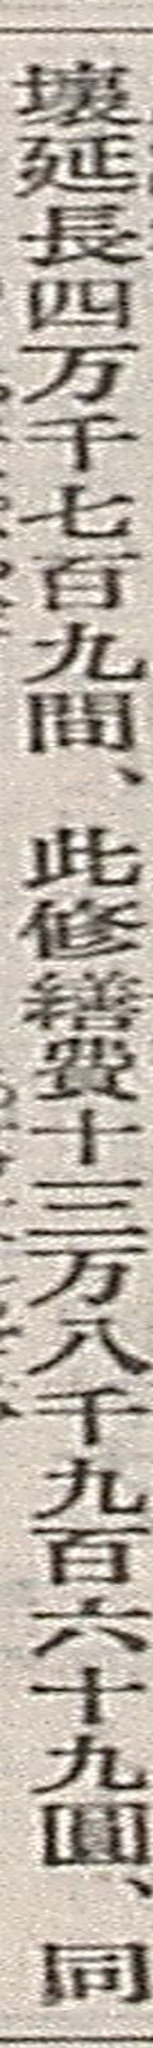壊延長四万千七百九間、此修繕費十三万八千九百六十九円、同
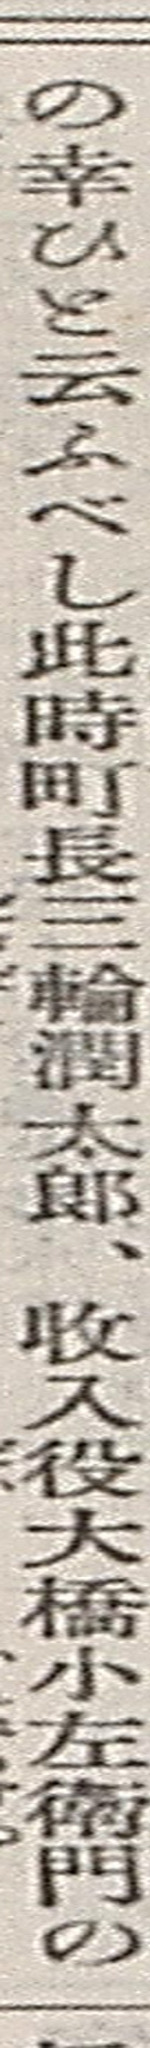の幸ひといふべし此時町長三輪潤太郎、収入役大橋小左衛門の
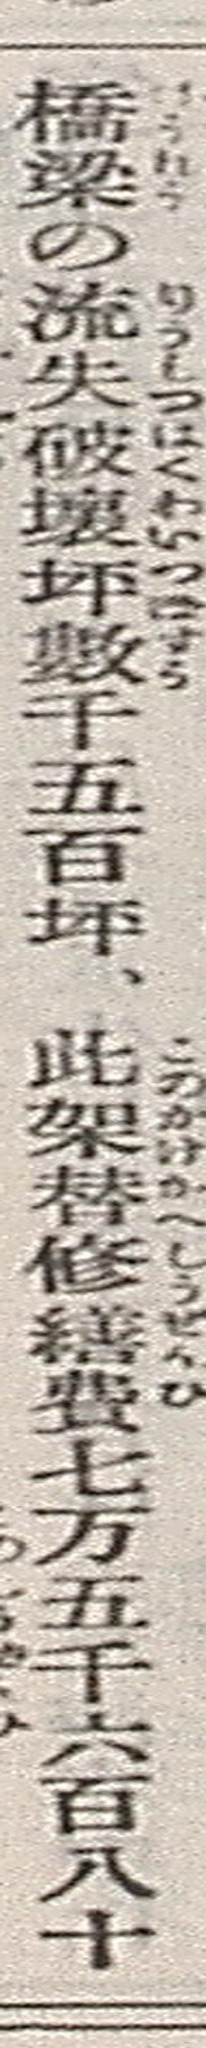橋梁の流失破壊坪数千五百坪、此架替修繕費七万五千六百八十
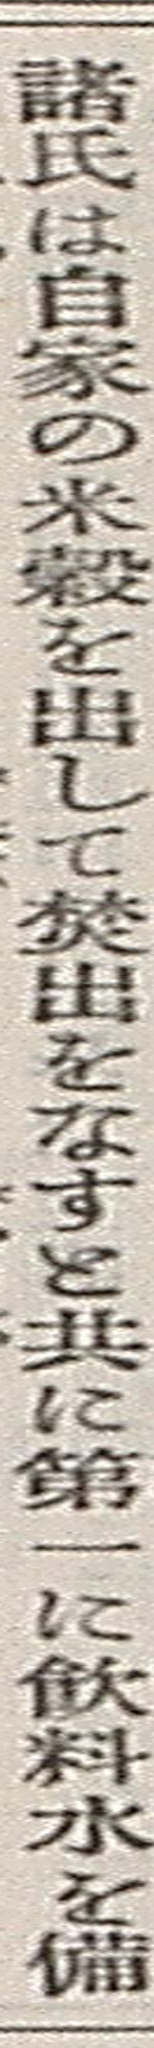諸氏は自家の米穀を出して焚出をなすと共に第一に飲料水を備
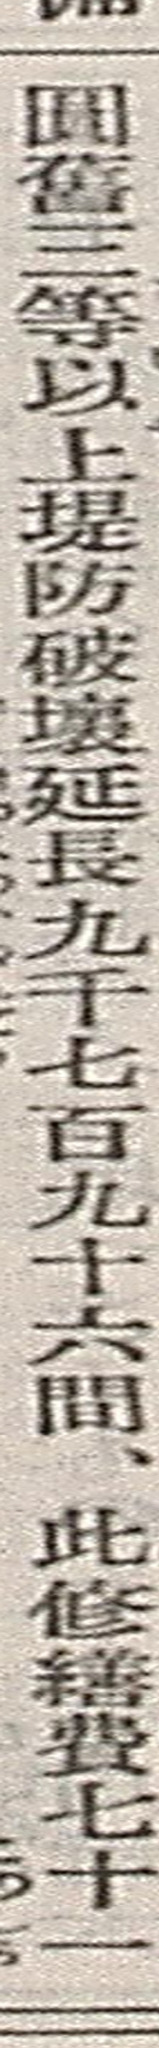円旧三等以上堤防破壊延長九千七百九十六間、此修繕費七十一
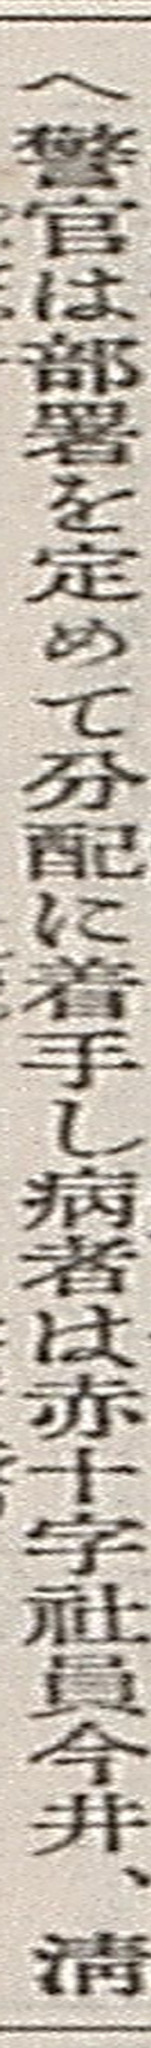へ警官は部署を定めて分配に着手し病者は赤十字社員今井、清
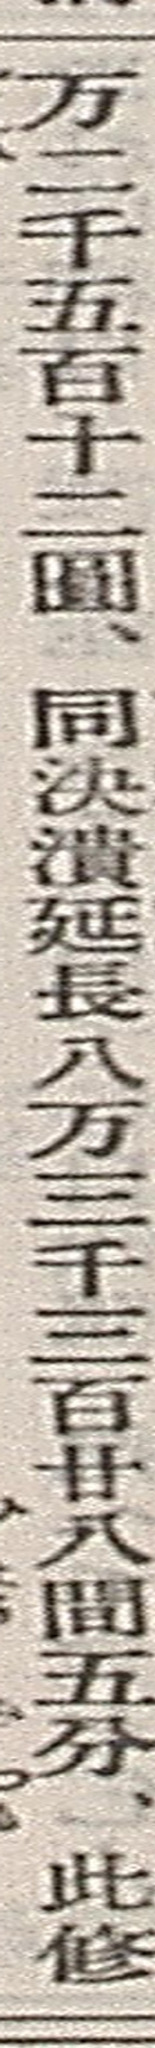万二千五百十二円、同決潰延長八万三千三百廿八間五分、此修
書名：風俗畫報臨時増刊第百二十八號　洪水被害録（下）
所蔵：東京大学地震研究所図書室 Earthquake Research Institute Library, The University of Tokyo, JAPAN
